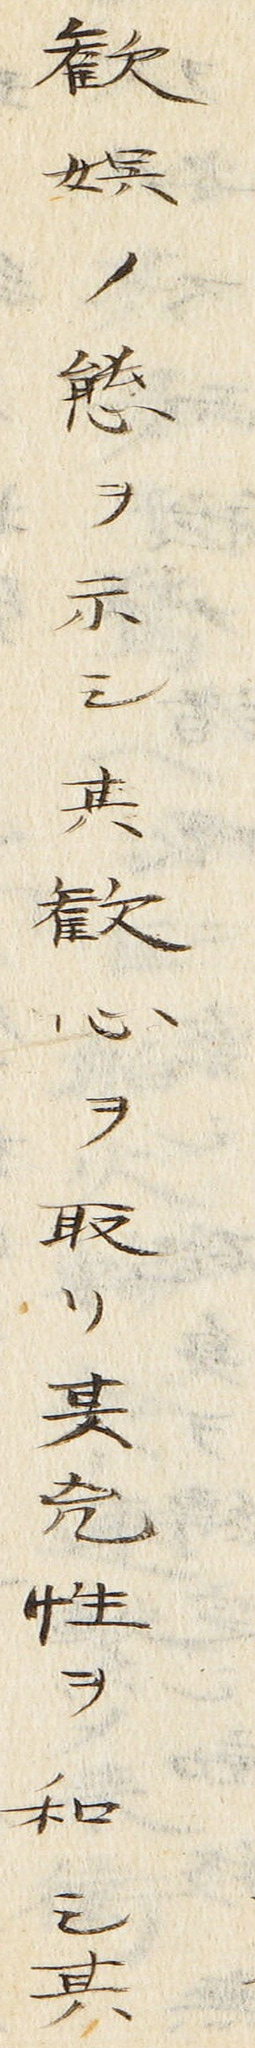歓娯ノ態ヲ示シ其歓心ヲ取リ其兇性ヲ和シ其
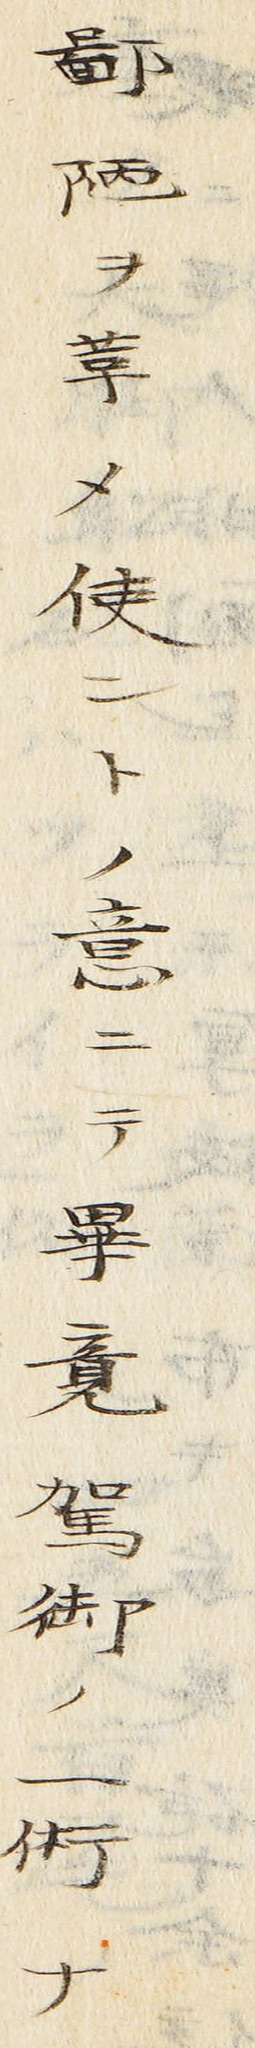鄙陋ヲ革シテ使ントノ意ニテ畢竟駕御ノ一術ナ
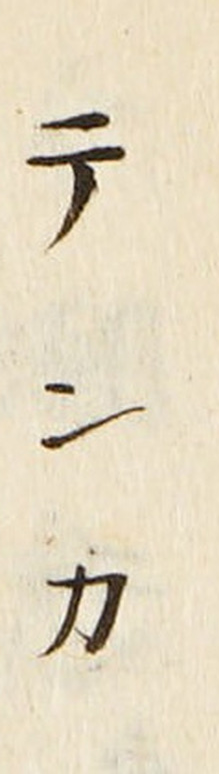テンカ
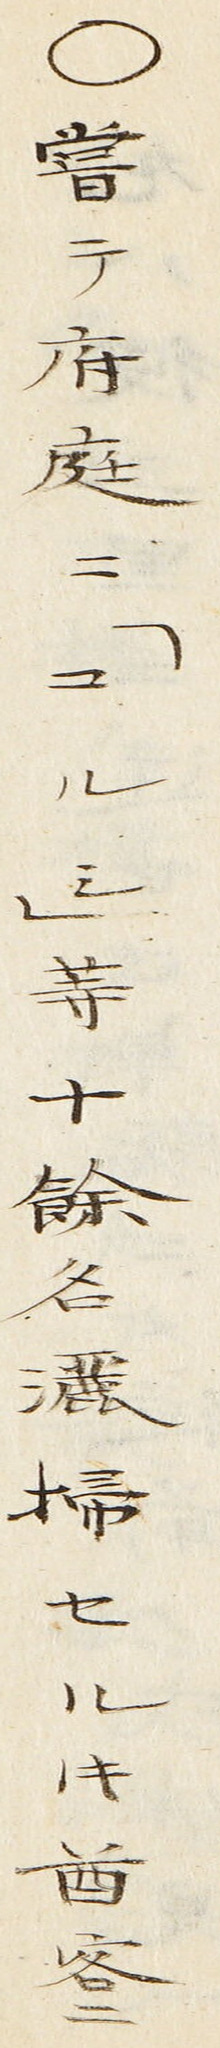○甞テ府庭ニ「コルシ」等十余名灑掃セルトキ酋客ニ
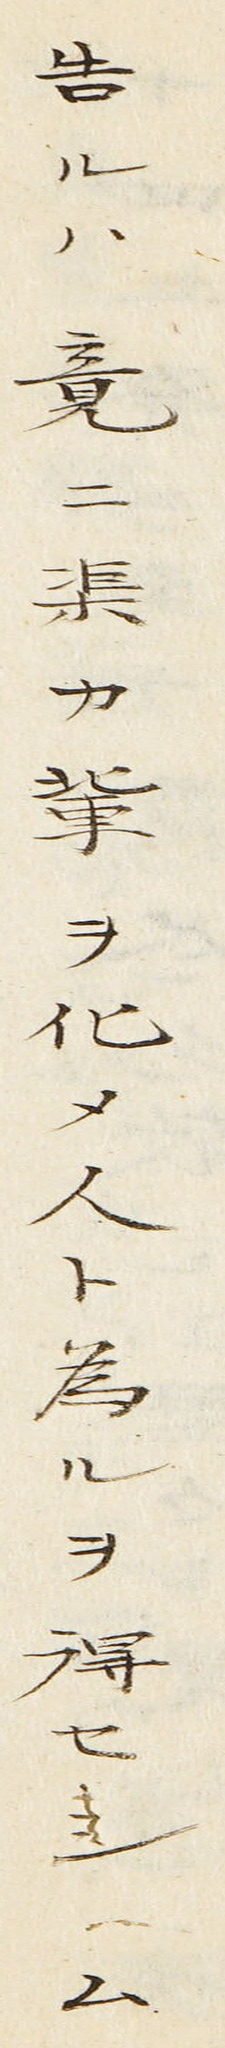告ルハ竟ニ渠カ軰ヲ化シテ人ト為ルヲ得セシム
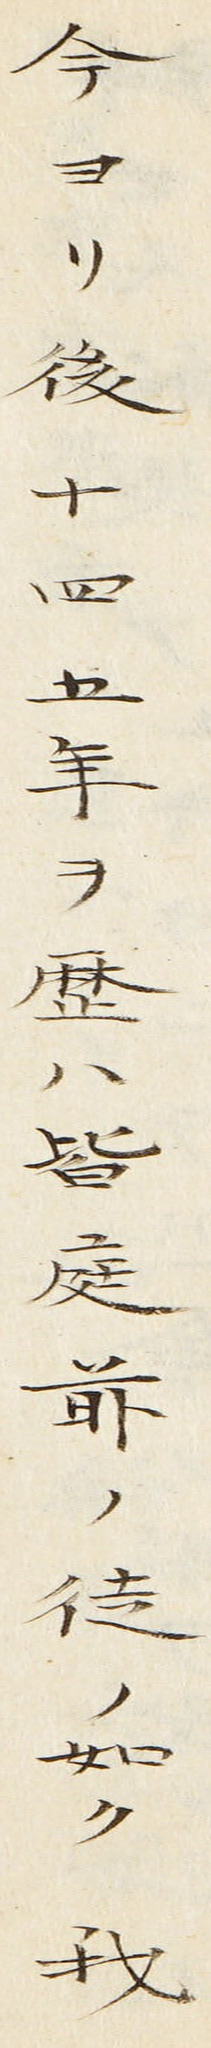今ヨリ後十四五年ヲ歴ハ皆庭前ノ徒ノ如ク我
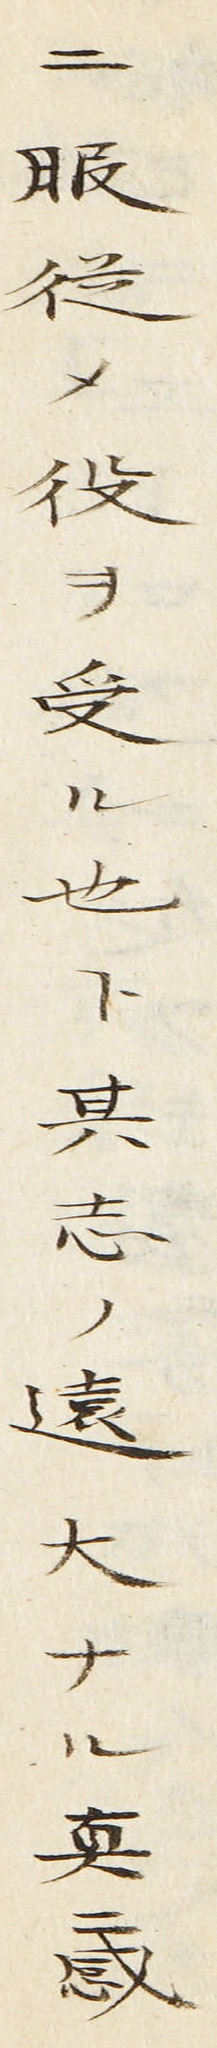ニ服従シテ役ヲ受ル也ト其志ノ遠大ナル真ニ感
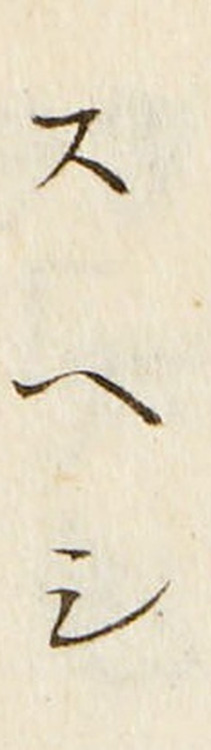スヘシ
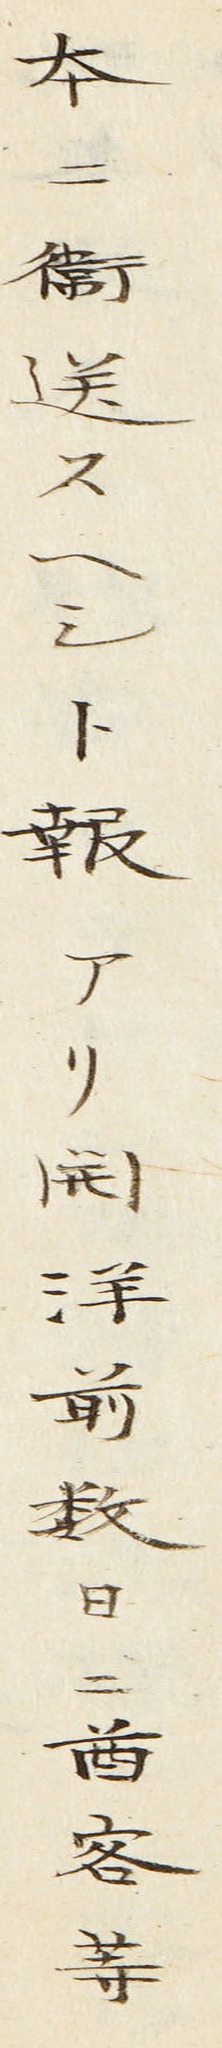本ニ衛送スヘシト報アリ開洋前数日ニ酋客等
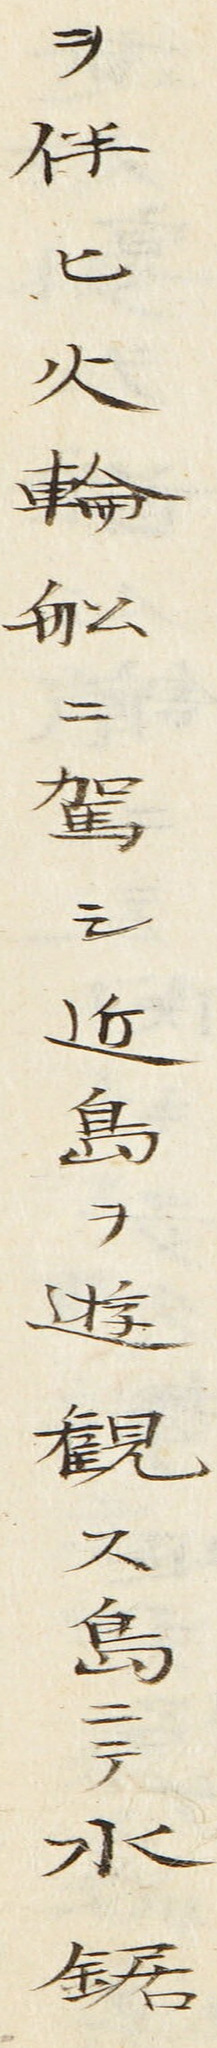ヲ伴ヒ火輪船ニ駕シ近島ヲ遊観ス島ニテ水鋸
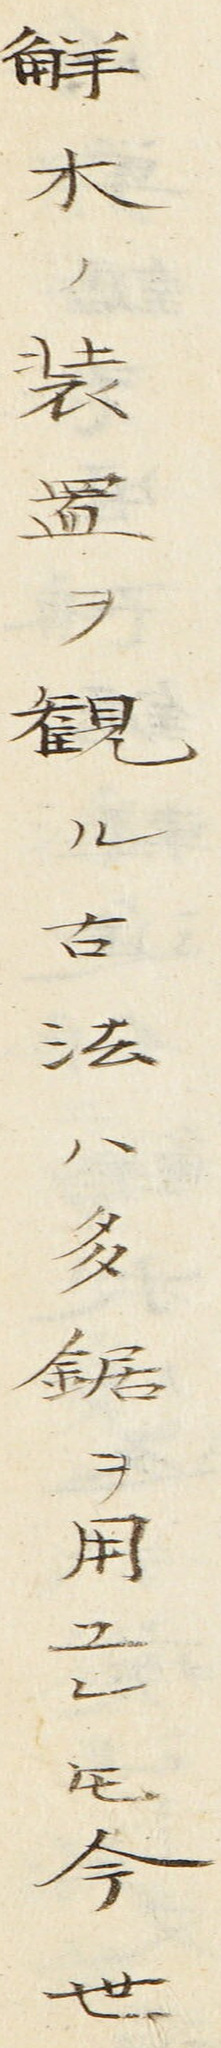觧木ノ装置ヲ観ル古法ハ多鋸ヲ用ユレトモ今世

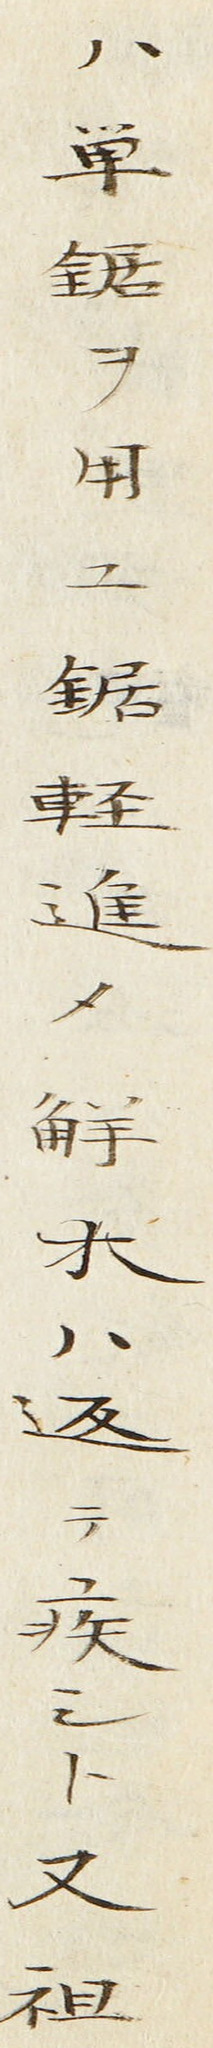ハ単鋸ヲ用ユ鋸軽進シテ觧木ハ返テ疾シト又祖
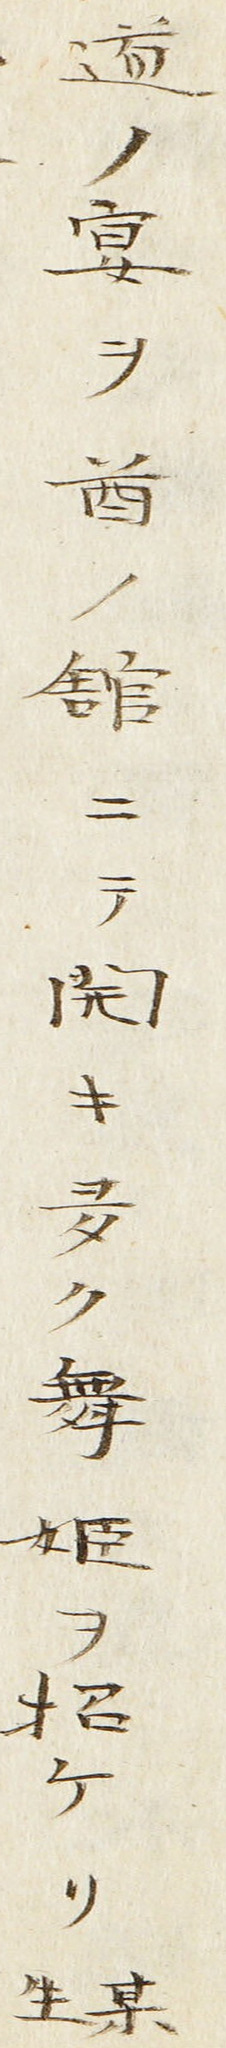道ノ宴ヲ酋ノ館ニテ開キ多ク舞姫ヲ招ケリ某生
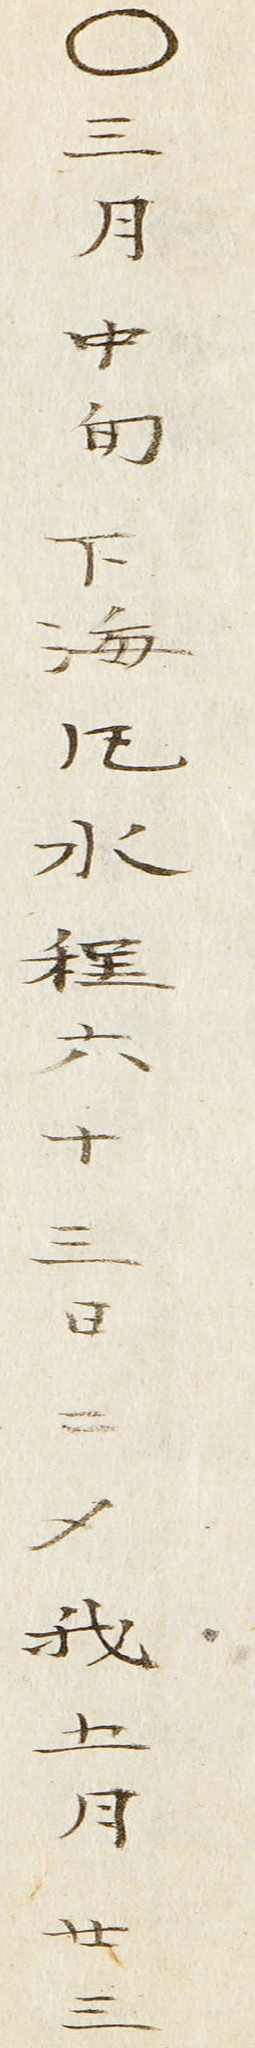○三月中旬下海凡水程六十三日ニシテ我五月廿三
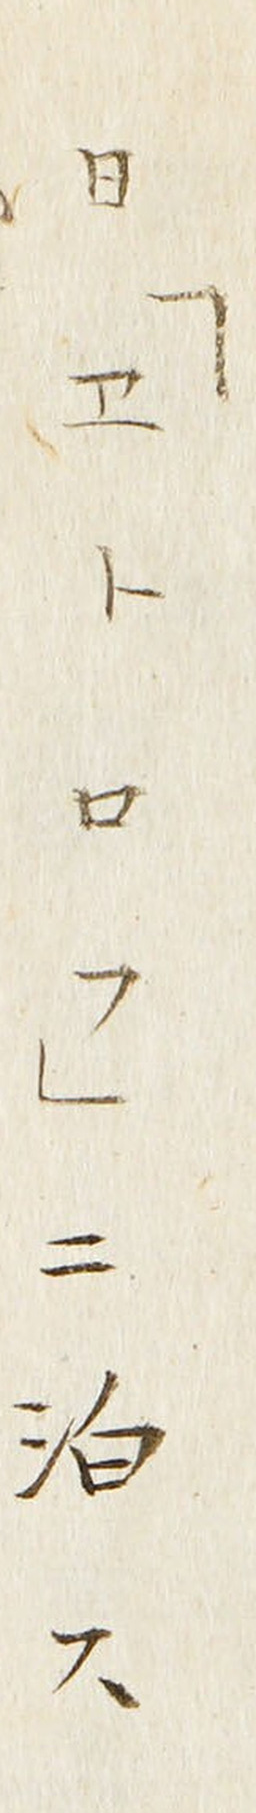日「ヱトロフ」ニ泊ス
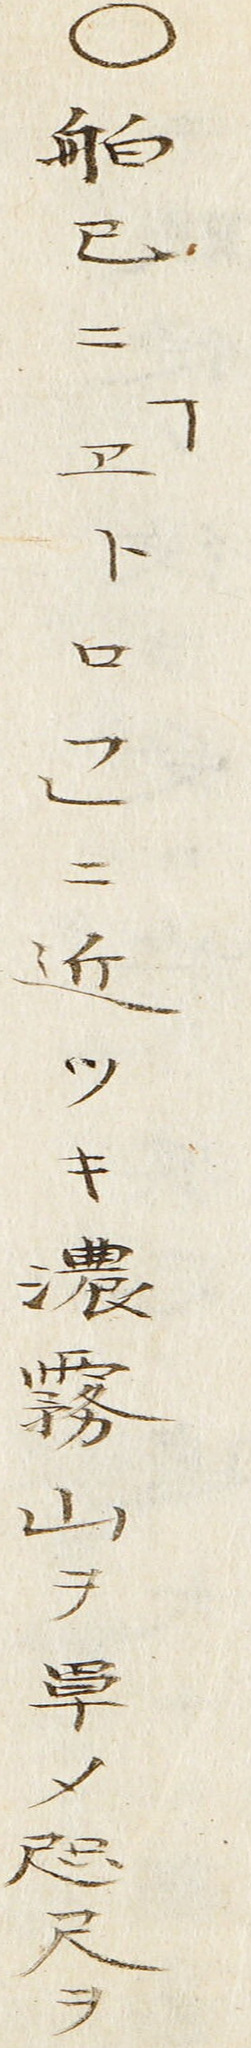○舶已ニ「ヱトロフ」ニ近ツキ濃霧山ヲ単シテ咫尺ヲ
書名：流蕃通書
